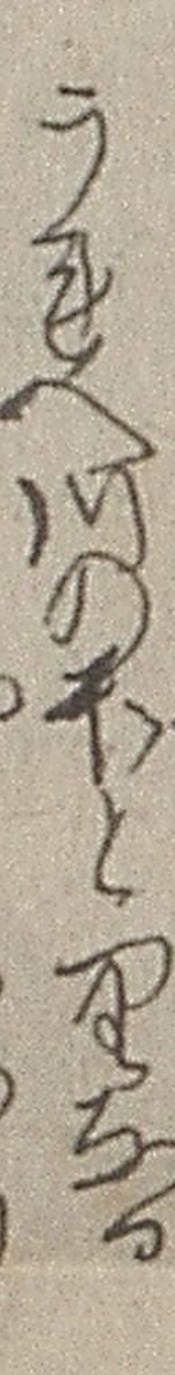うれへ川のほとりなる
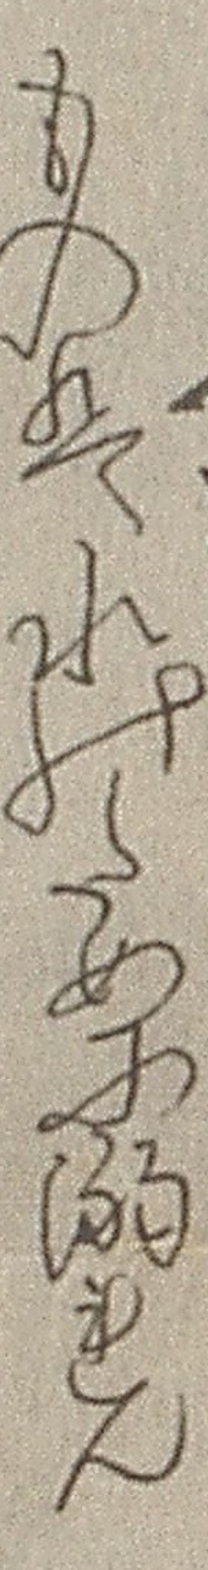ものは水のために溺れん
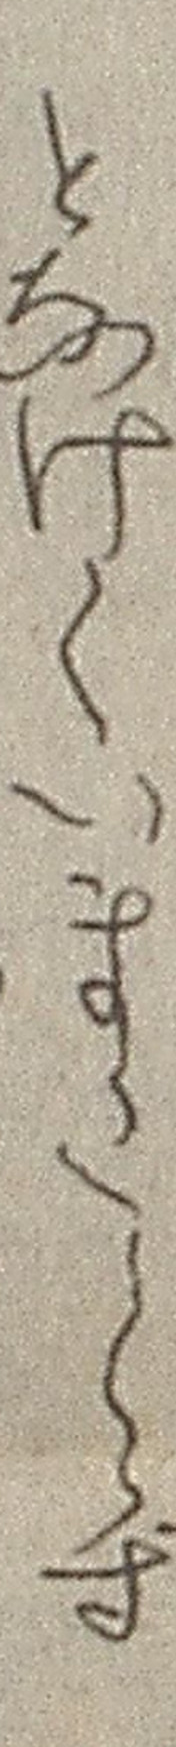となげくいまたしらす
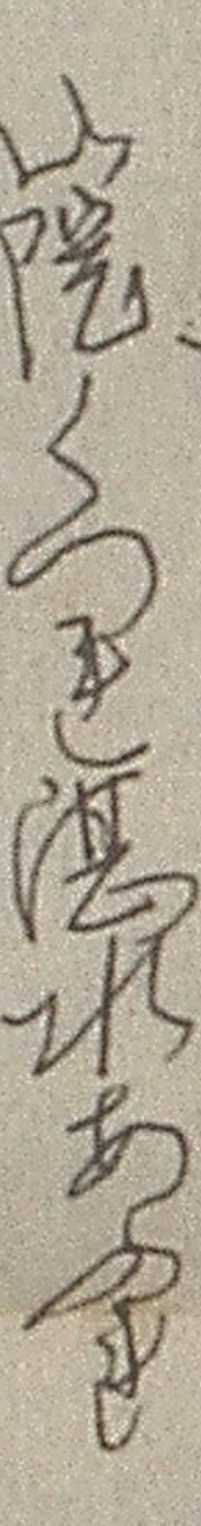山院くつれ湛水あふれ
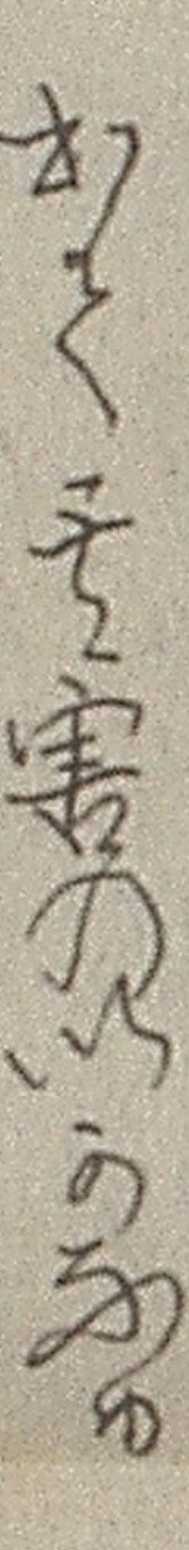出て其害のいかなる
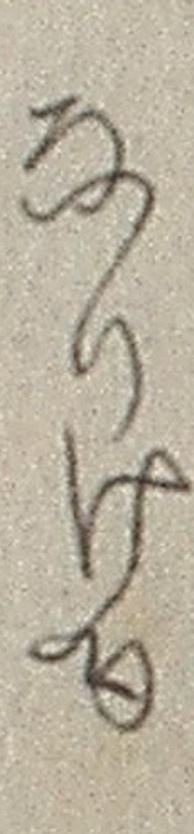なりける
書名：弘化四年信濃地震洪水圖
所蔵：東京大学地震研究所図書室 Earthquake Research Institute Library, The University of Tokyo, JAPAN
